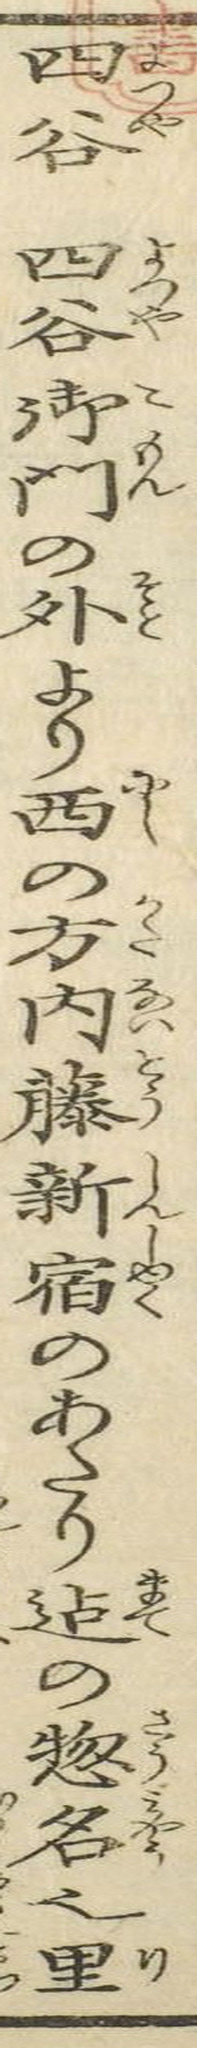四谷四谷御門の外より西の方内藤新宿のあたり迠の惣名也里
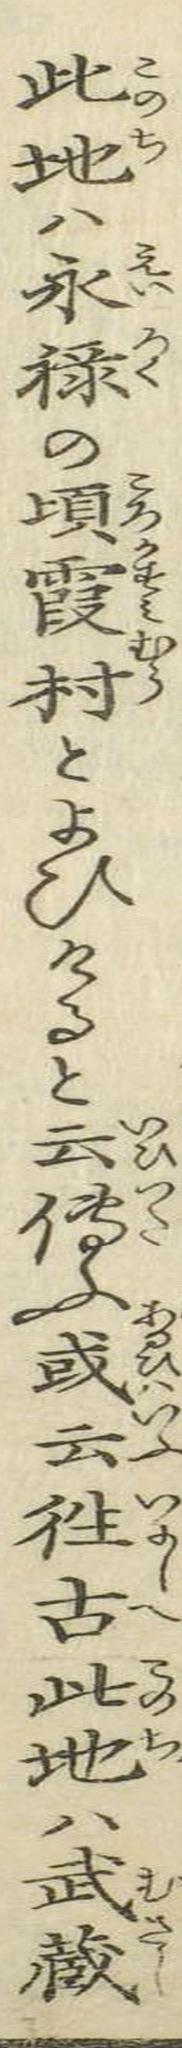此地は永禄の頃霞村とよひけると云傳ふ或云往古此地は武蔵
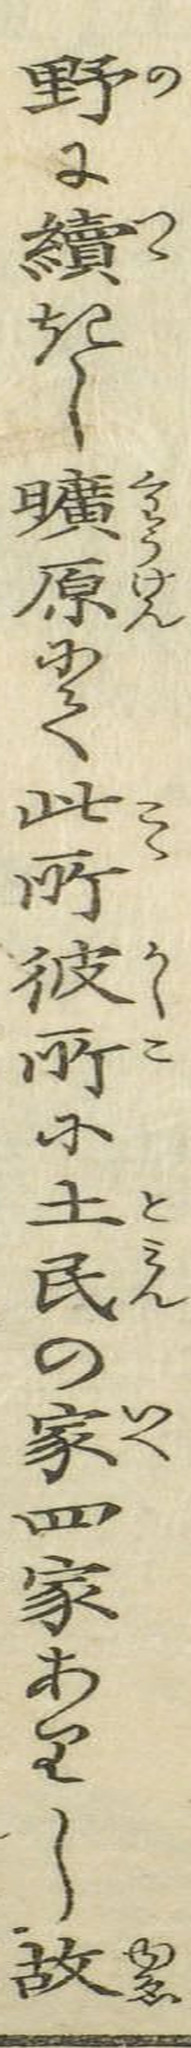野に続きし曠原にて此所彼所に土民の家四家ありし故
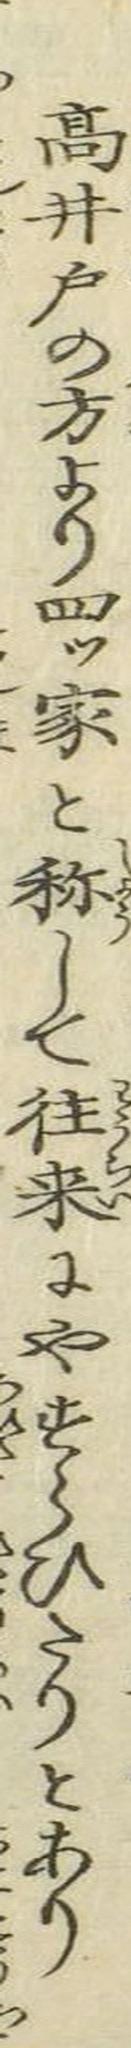高井戸の方より四ッ家と称して往来にやすらひたりとあり
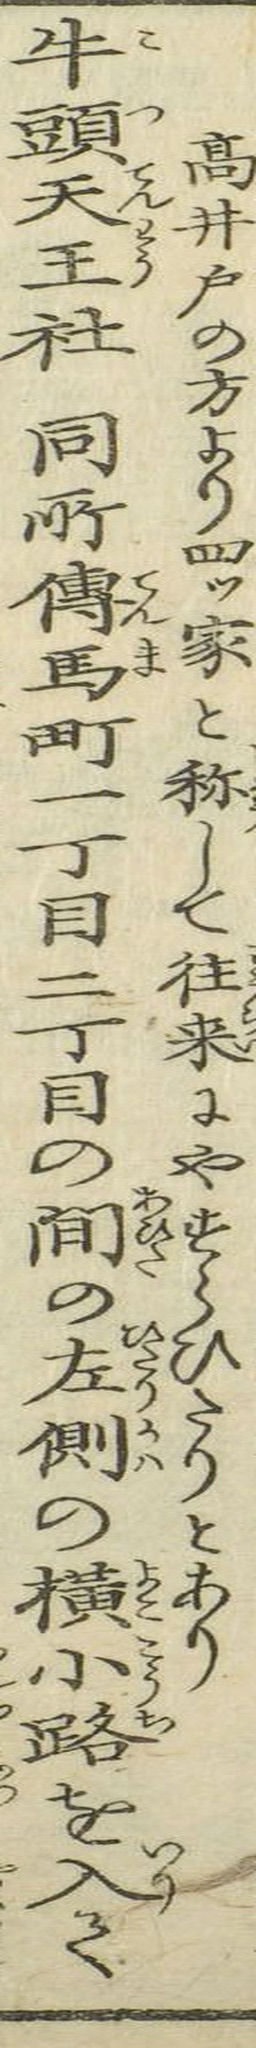牛頭天王社同所伝馬町一丁目二丁目の間の左側の横小路を入て

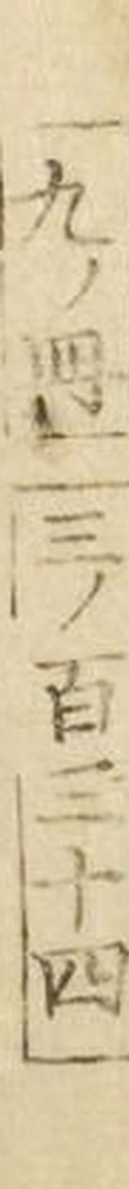九ノ冊三ノ百三十四

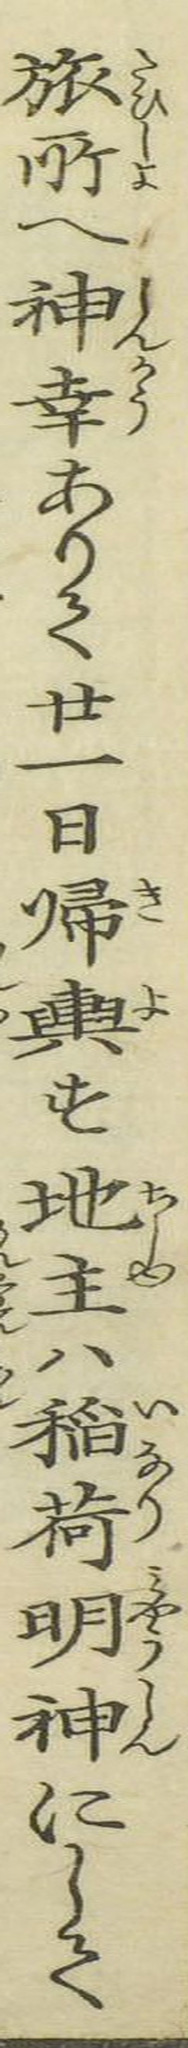旅所へ神幸ありて廿一日帰輿す地主は稲荷明神にして
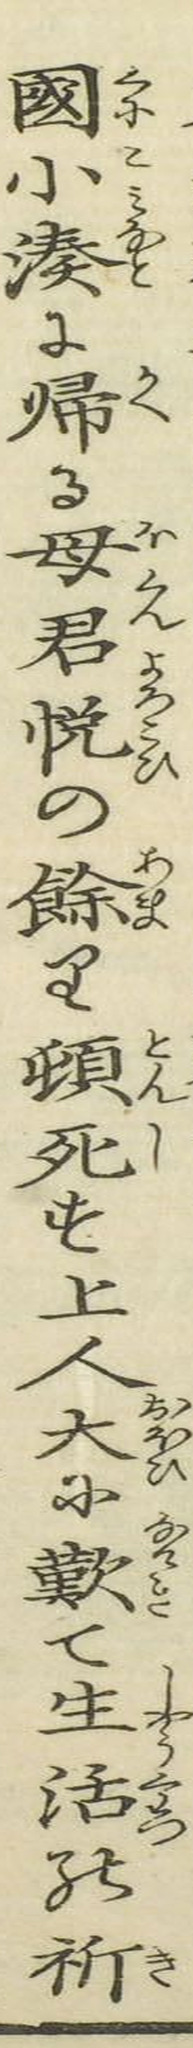国小湊に帰る母君悦の余り頓死す上人大に歎て生活の祈
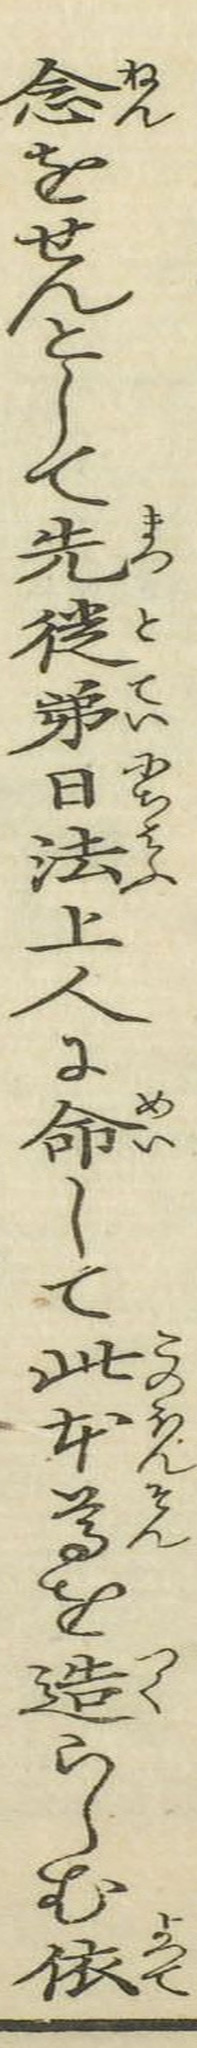念をせんとして先徒弟日法上人に命して此本尊を造らしむ依
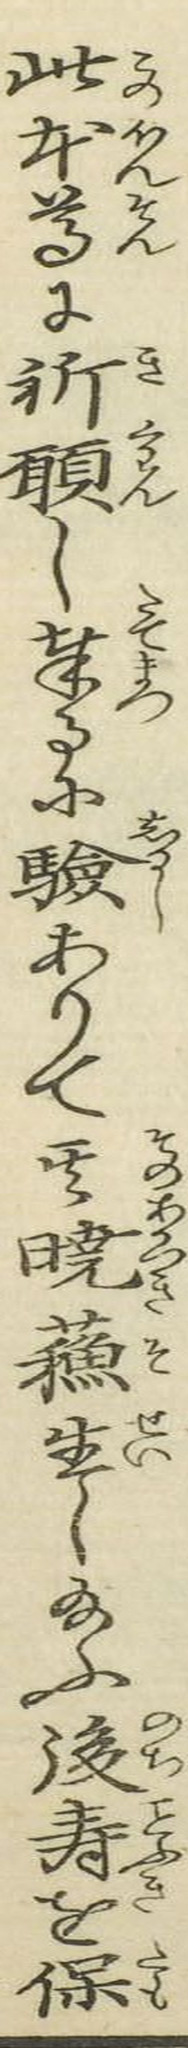此本尊に祈願し奉るに験ありて其暁蘇生し給ふ後寿を保
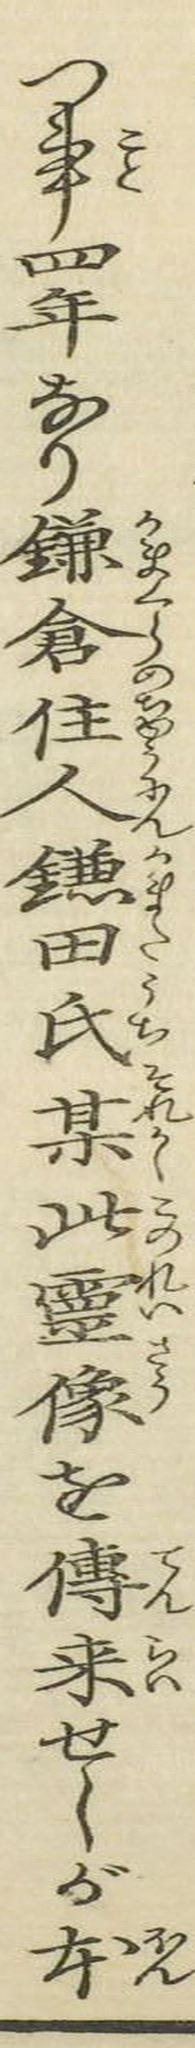つ事四年なり鎌倉住人鎌田氏某此霊像を伝来せしが本
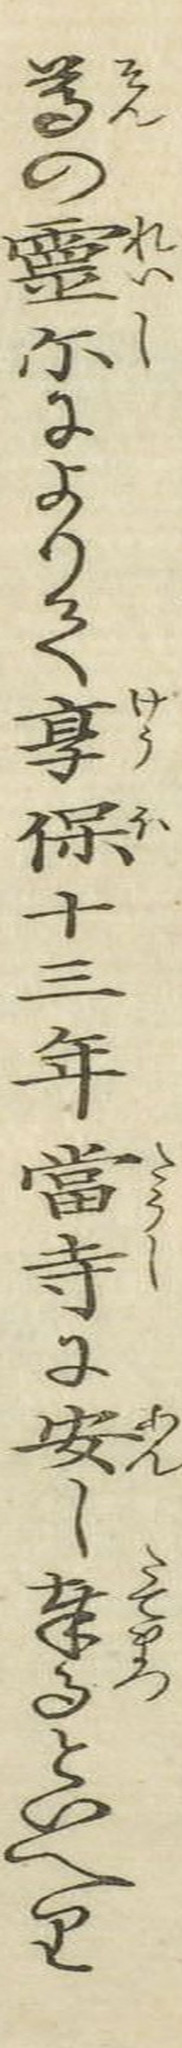尊の霊尓によりて享保十三年当寺に安し奉るといへり
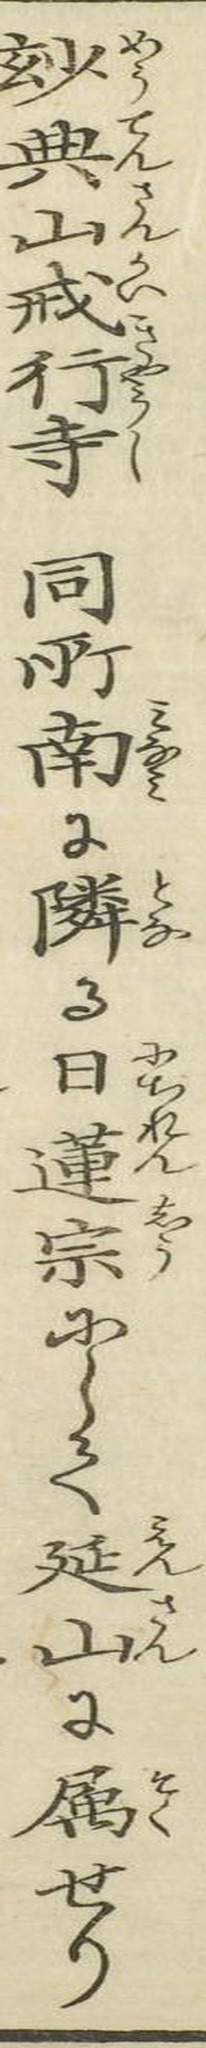玅典山戒行寺同所南に隣る日蓮宗にして延山に属せり
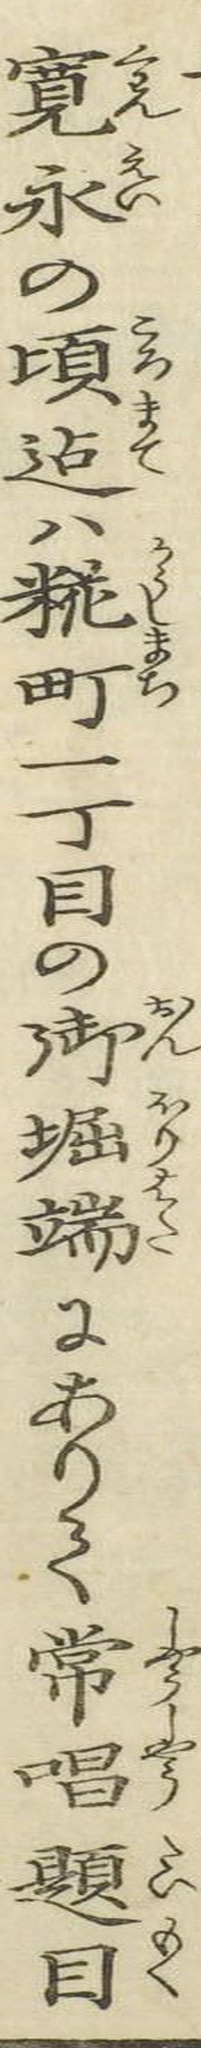寛永の頃迠は糀町一丁目の御堀端にありて常唱題目
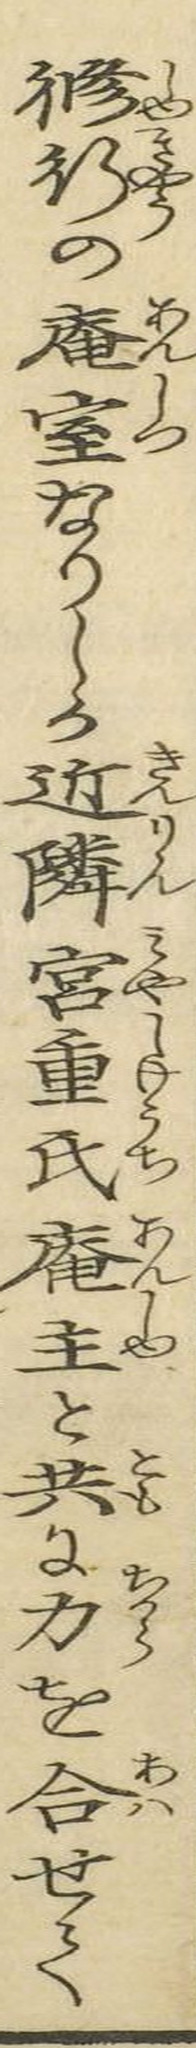修行の庵室なりしか近隣宮重氏庵主と共に力を合せて
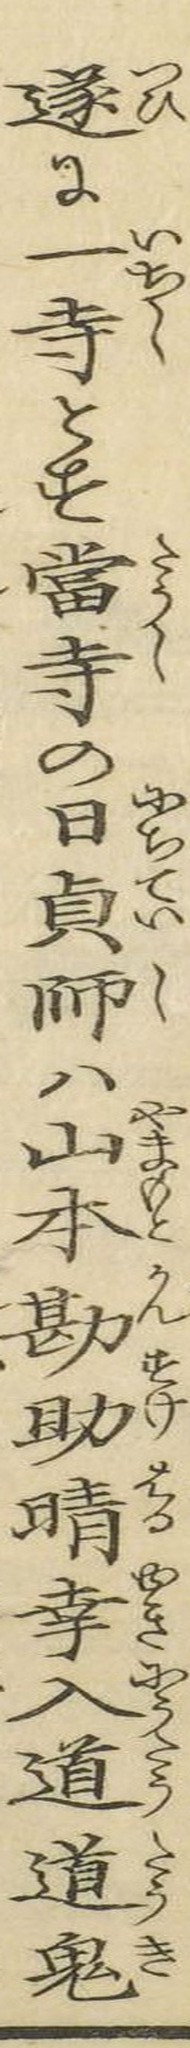遂に一寺とす當寺の日貞師は山本勘助晴幸入道道鬼
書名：江戸名所図会 20巻 巻之9
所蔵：東京学芸大学教育コンテンツアーカイブ
